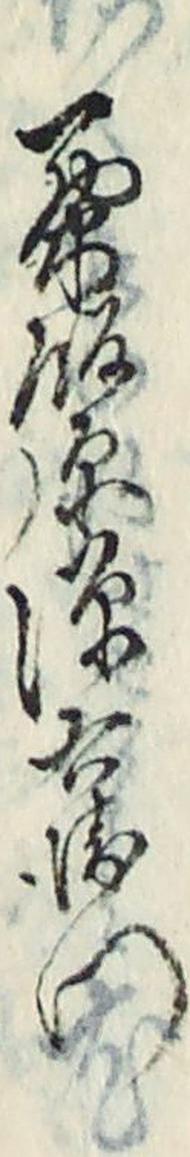粟飯原源右衛門
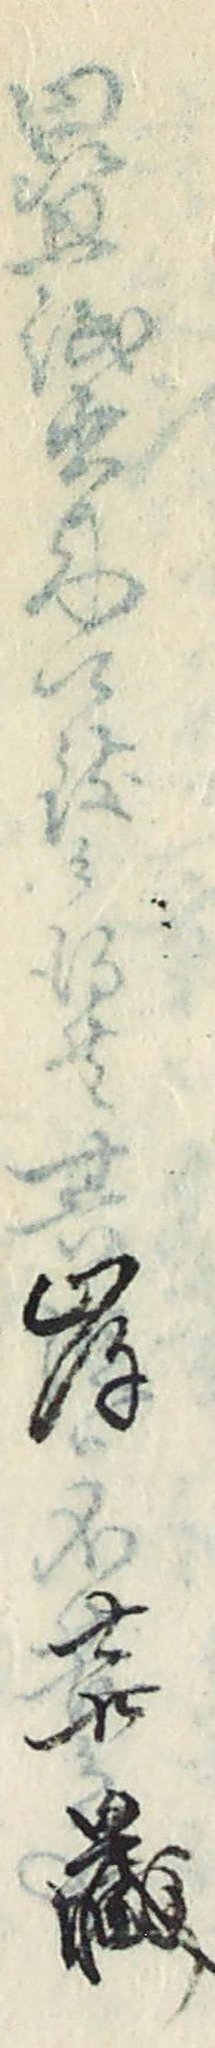岸喜蔵
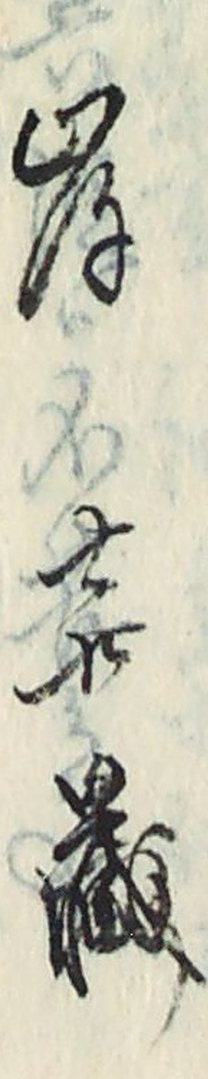岸喜蔵
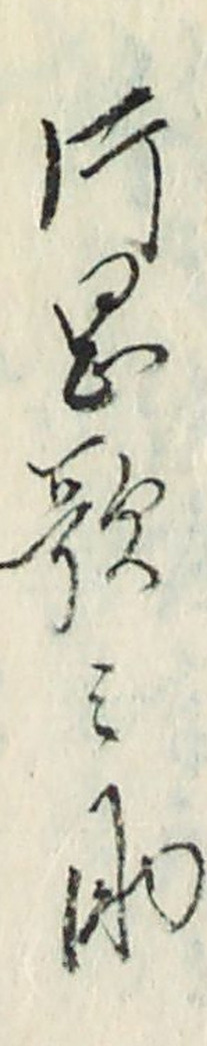片岡歌之助
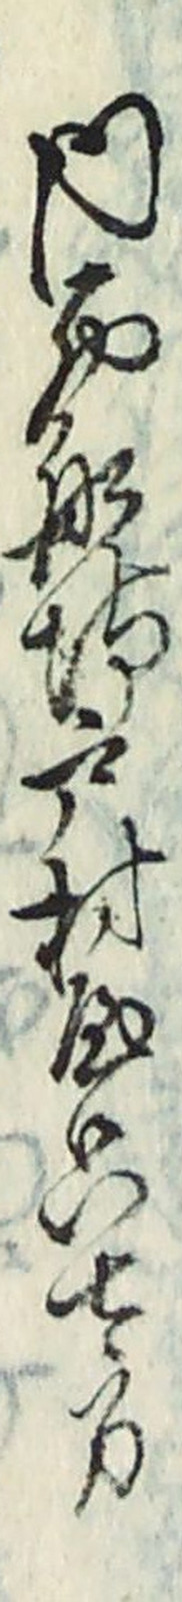内西船場戸村屋只七方
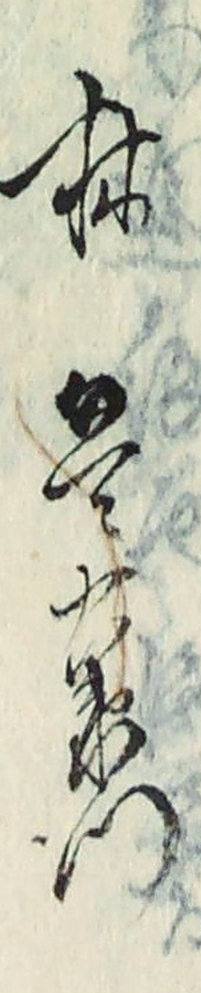林豊右衛門
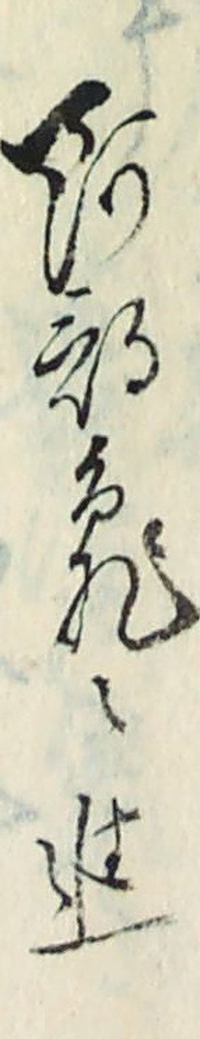阿部亀之進
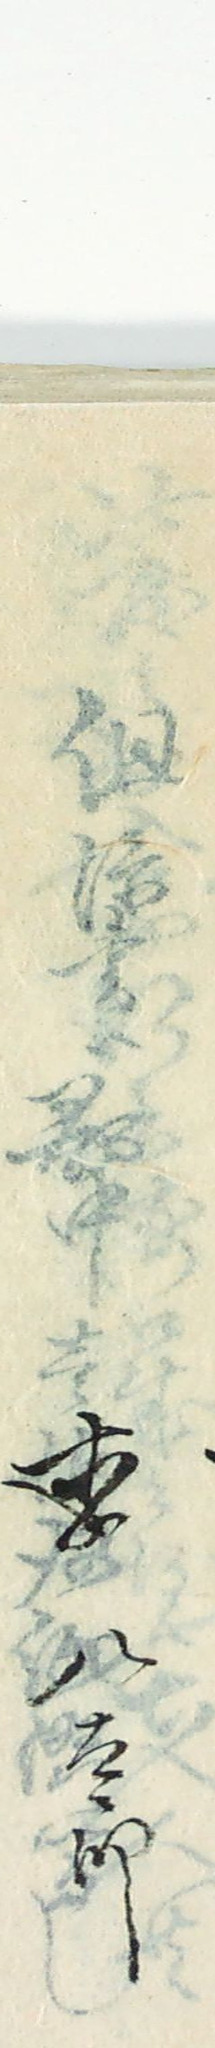森八太郎
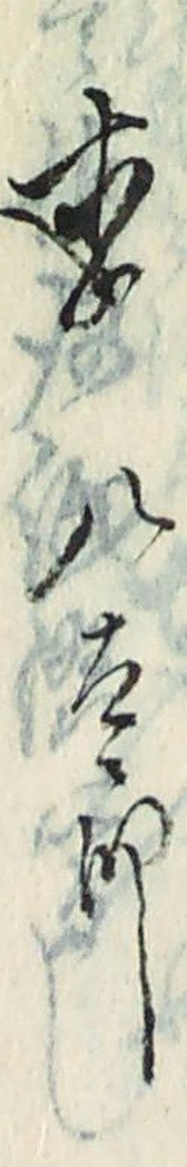森八太郎
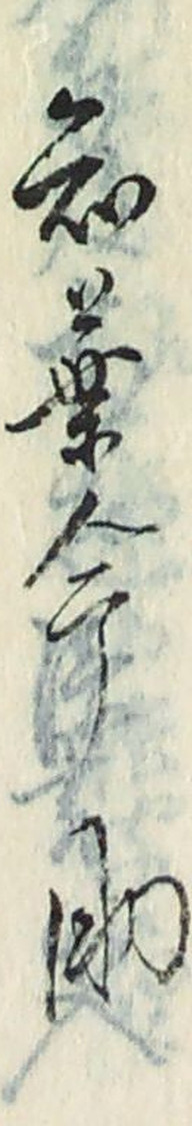知葉今助
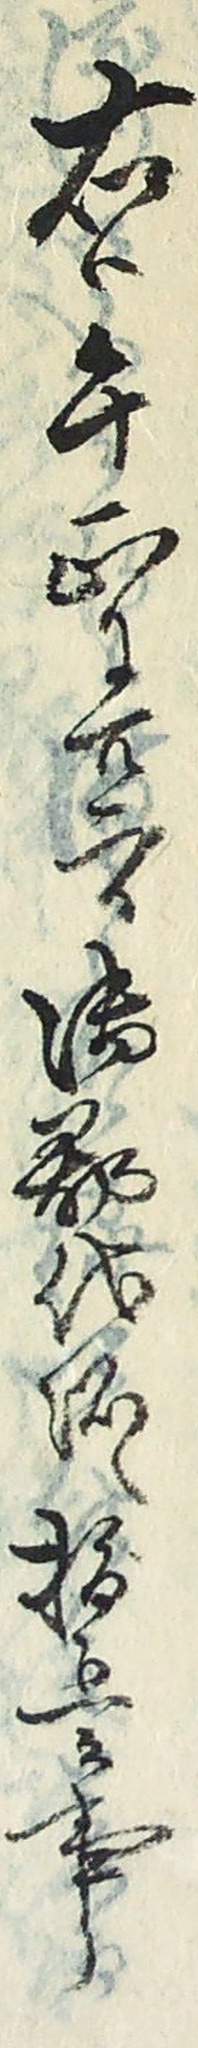右ハ午正月廿二日御郡代所へ指上候事

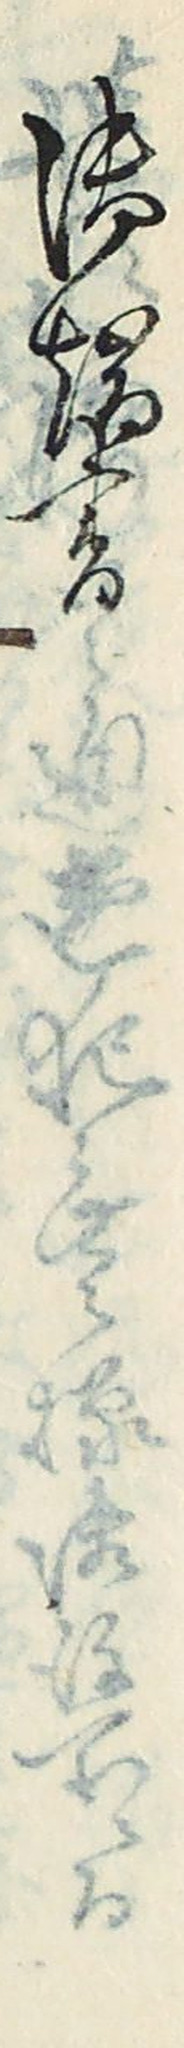御端書
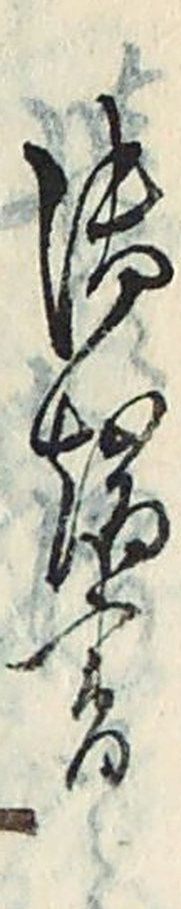御端書
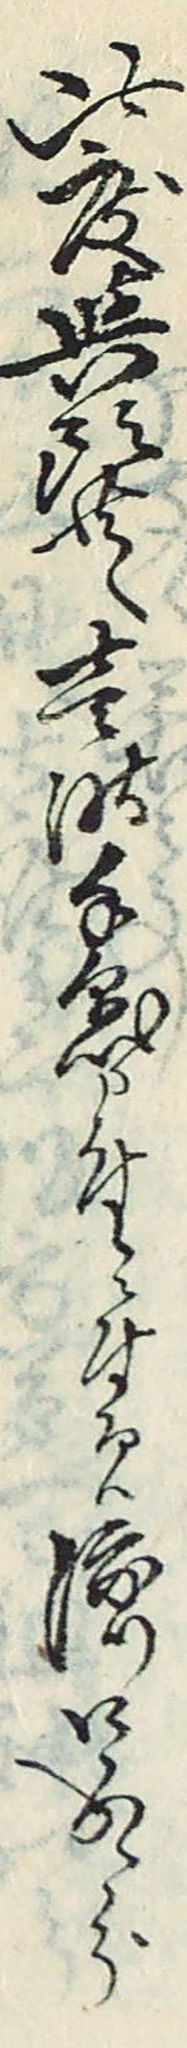此度與頭共へ壱時手懸申付候ニ付而ハ済口成候分
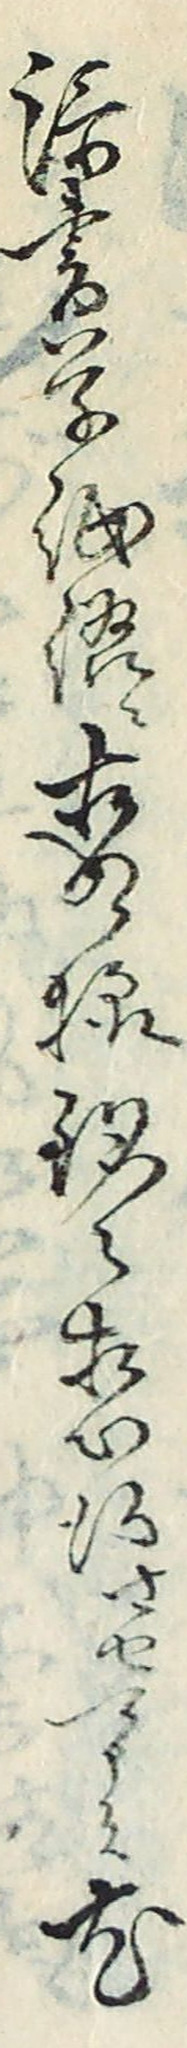添書草紙綴ニ相成候様銘々相心得させ可申候尤
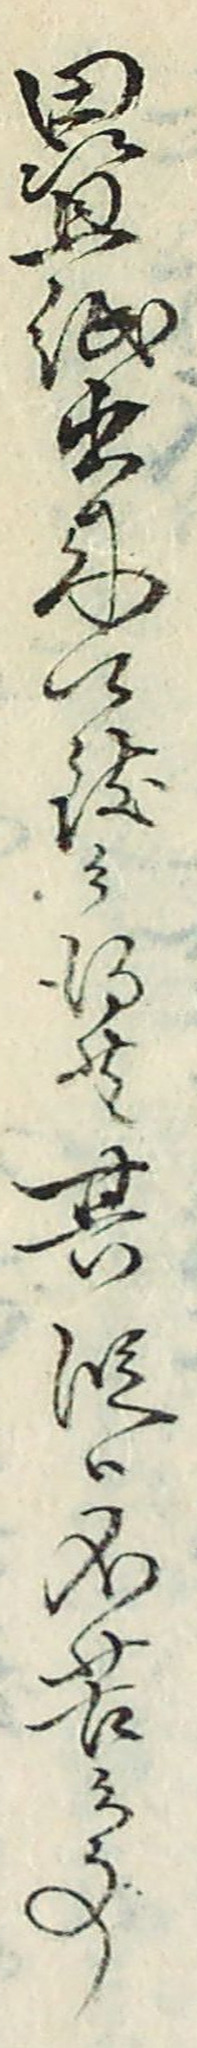畳紙出来可致候得共其段ハ不苦候事
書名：諸御趣意書并御下知向之写
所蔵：鳴門教育大学 Naruto University of Education
